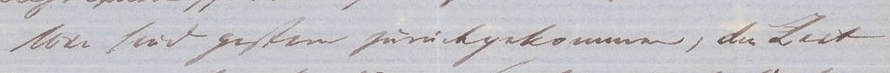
Wir sind gestern zurückgekommen, die Zeit
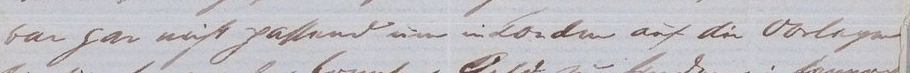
war gar nicht passend um in London auf die Vorlage
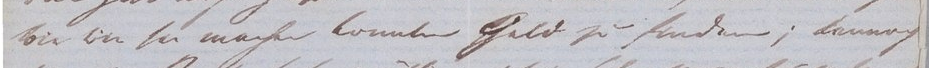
wie wir sie machen konnten Geld zu finden; dennoch
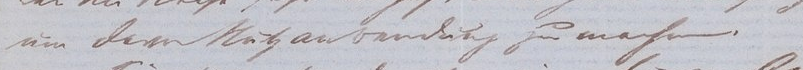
um davon Nutzanwendung zu machen.
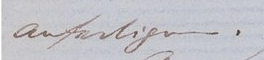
anfertigen.
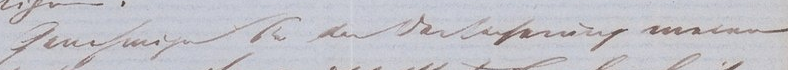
Genehmigen Sie die Versicherung meiner
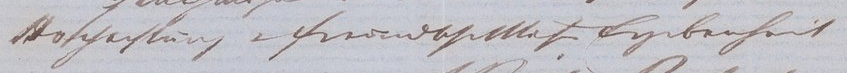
Hochachtung & freundschaftlicher Ergebenheit
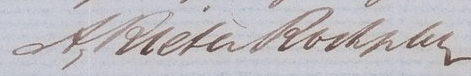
A. Rieter-Rothpletz
